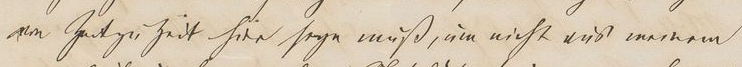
von Zeit zu Zeit hier seyn muß, um nicht aus meinem
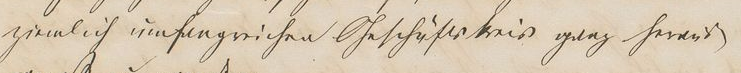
ziemlich umfangreichen Geschäftskreis ganz heraus
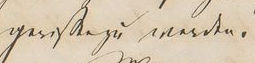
gerissen zu werden.
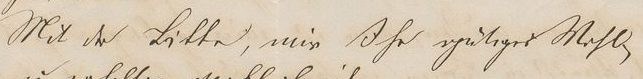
Mit der Bitte, mir Ihr gütiges Wohl-
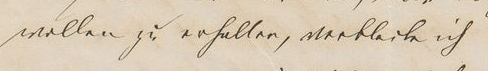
wollen zu erhalten, verbleibe ich
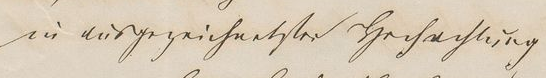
in ausgezeichneter Hochachtung
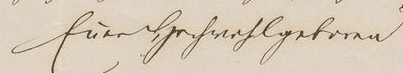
Euer Hochwohlgeboren
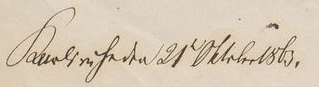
Karlsruhe den 21t Oktober
